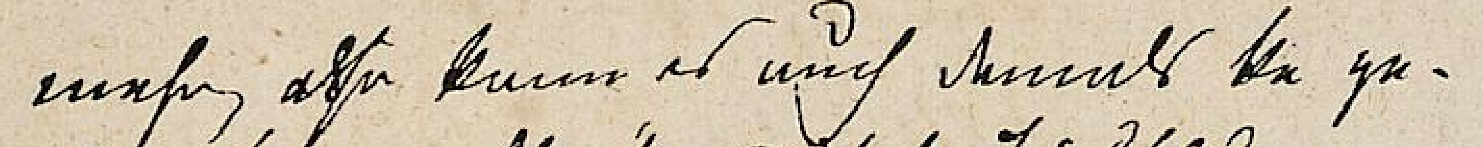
mehr, also kann es auch damals kn ge¬
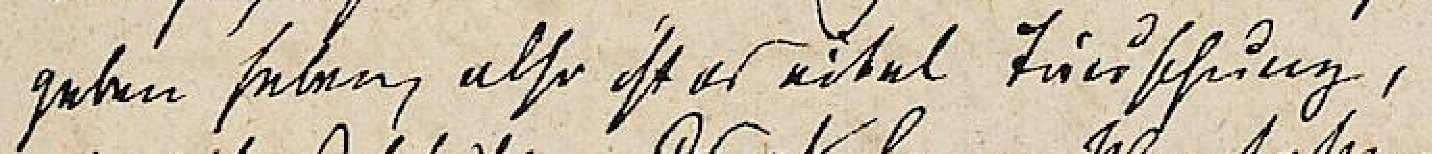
geben haben, also ist es eitel Täuschung,
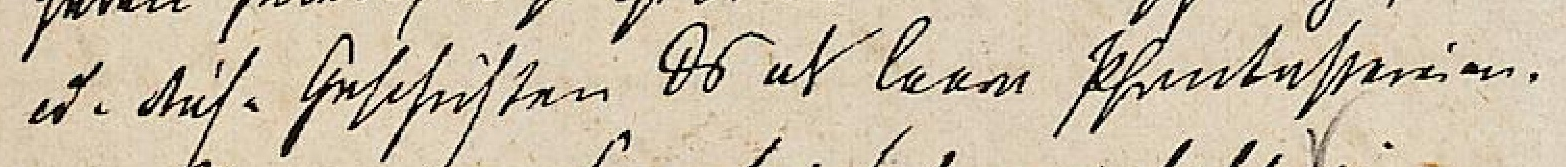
u. dies. Geschichten os als leere Phantastereien.
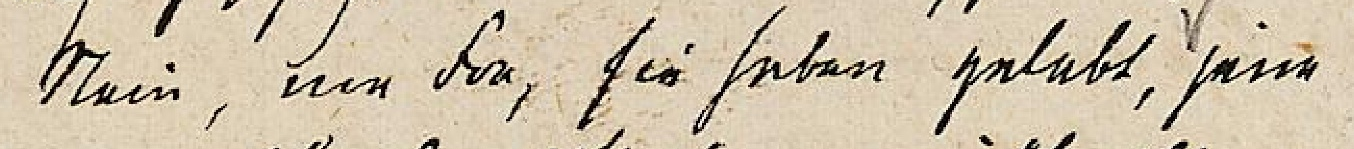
Nein, m. Fr., sie haben gelebt, jene
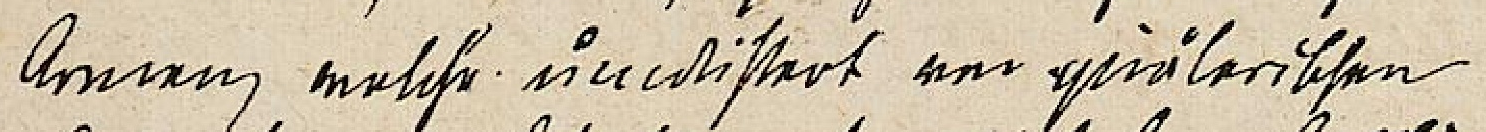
Armen, welche undistert von quälerischen
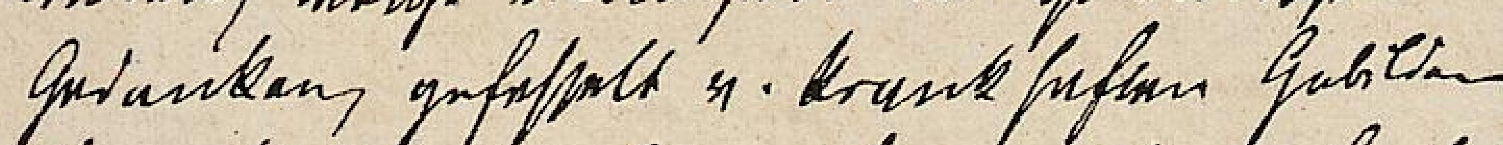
Gedanken gefesselt u. krank sahen Gebilden
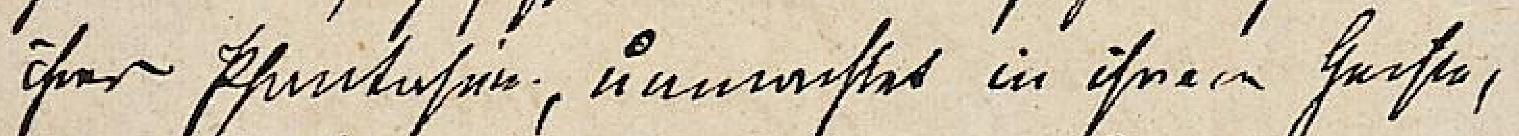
ihrer Phantasie, umnachtet in ihrem Geiste,
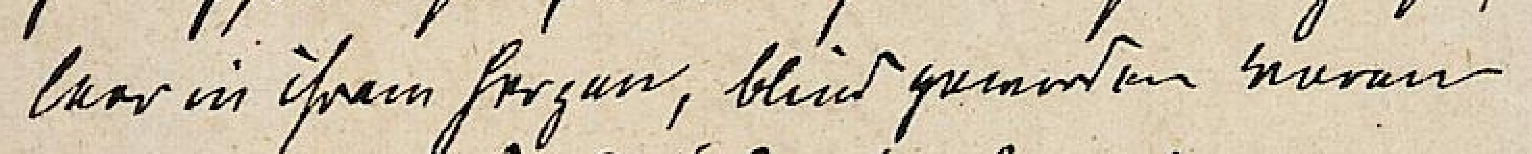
leer in ihrem Herzen, bling geworden waren
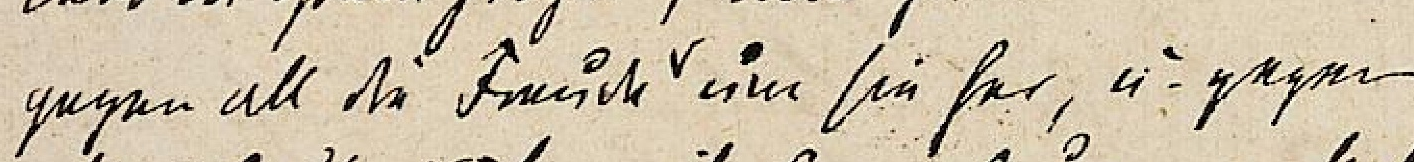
gegen all die Freude um sie her, u. gegen
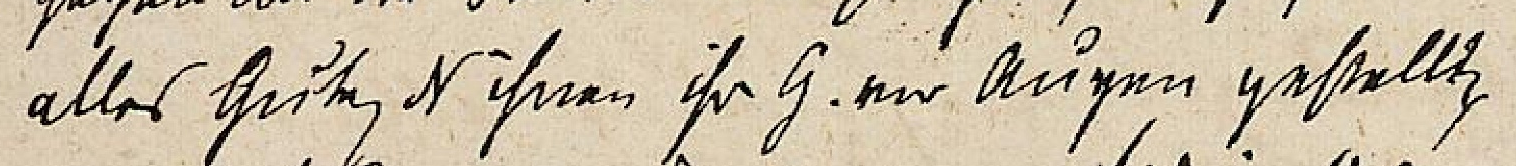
alles Gute, ds ihnen ihr G. vor Augen gestellt,
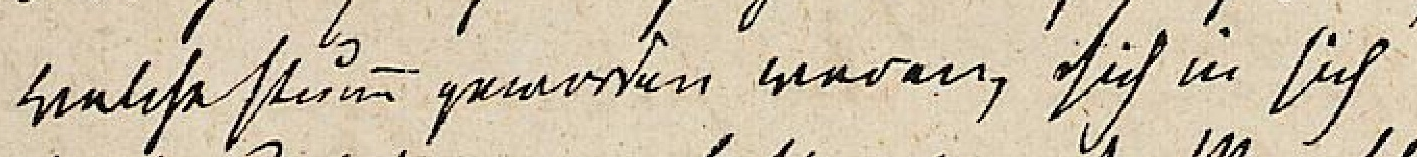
welche stum geworden waren, sich in sich
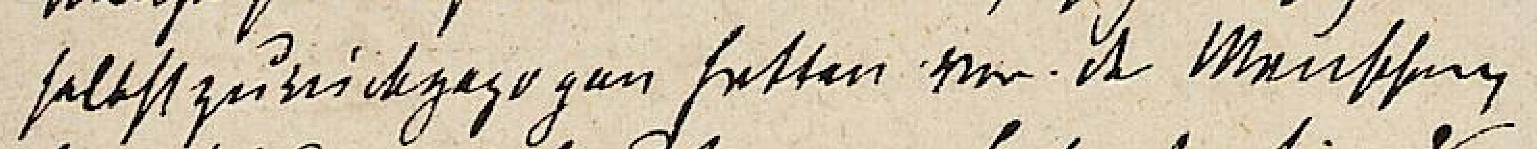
selbst zurückgezogen hatten vor den Menschen,
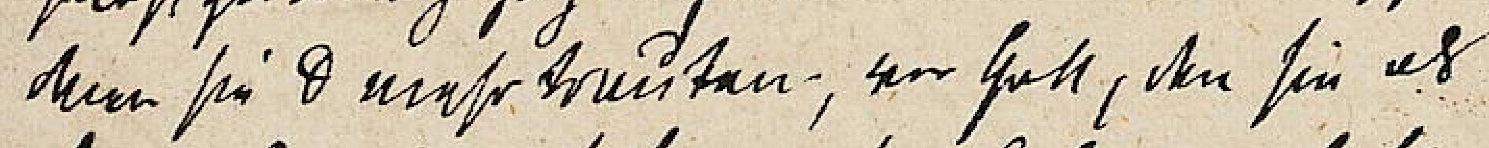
denen sie o mehr trauten, vor Gott, den sie als
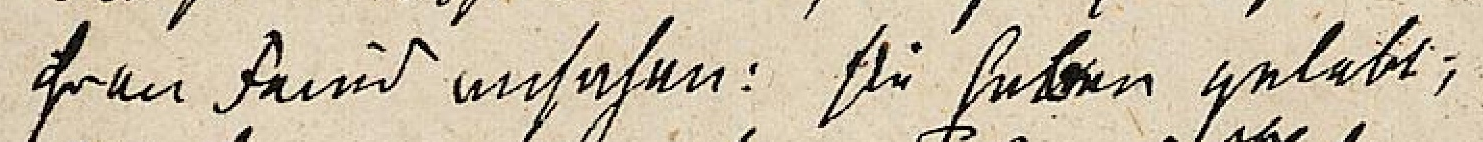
ihren Feind ansahen: sie haben gelebt,
